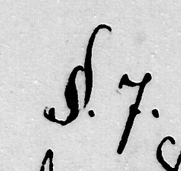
§. 7.
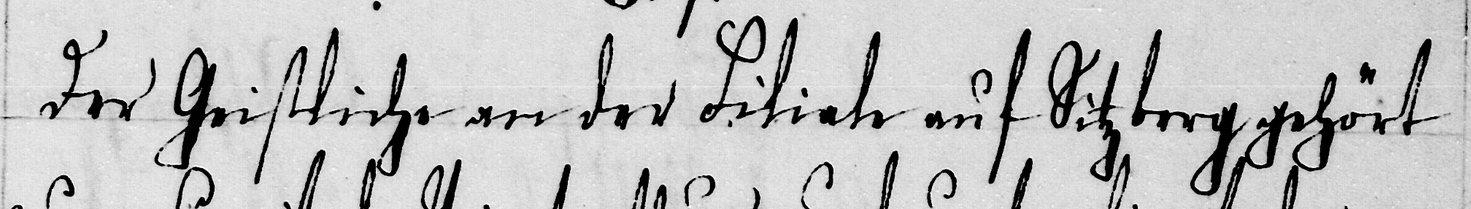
Der Geistliche an der Filiale auf Sitzberg gehört
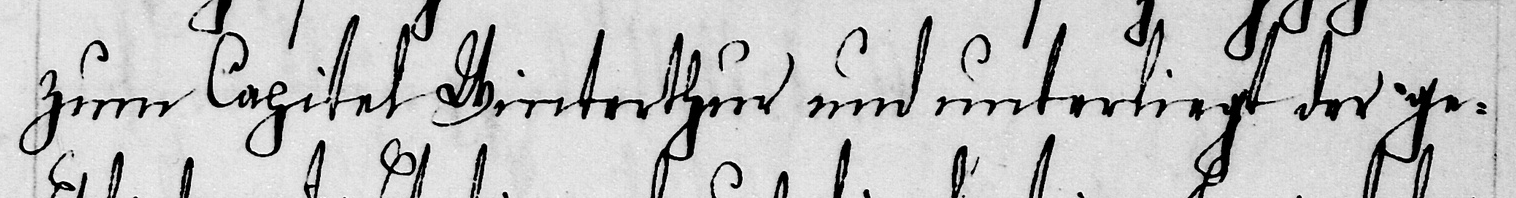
zum Capitel Winterthur und unterliegt der ges¬
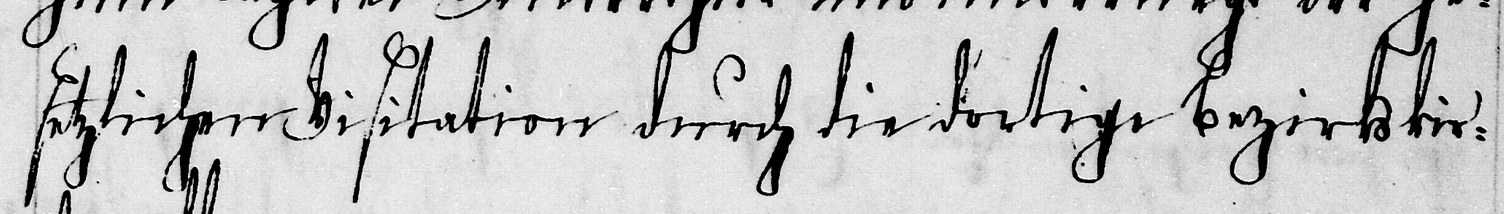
etzlichen Visitation durch die dortige Bezirkskirc¬
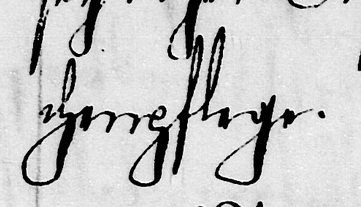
henpfleg¬
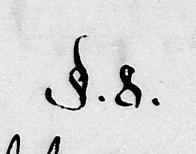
§. 8.
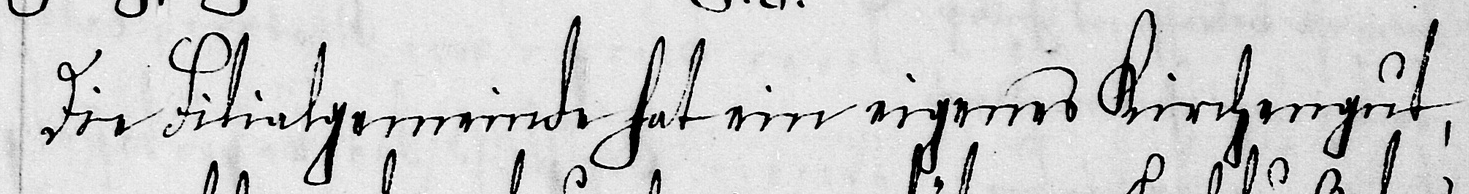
Die Filialgemeinde hat ein eigenes Kirchengut,
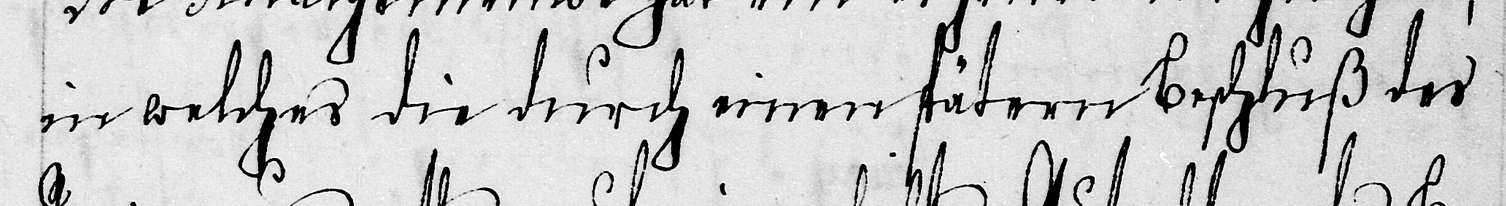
in welches die durch einen spätern Beschluß des
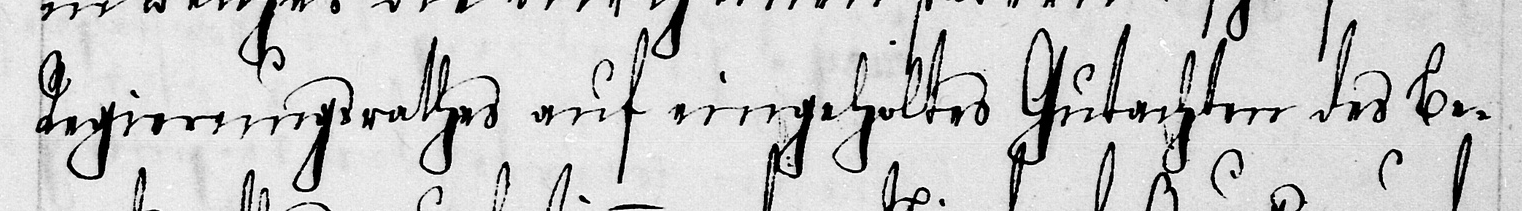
Regierungsrathes auf eingeholtes Gutachten des Be¬
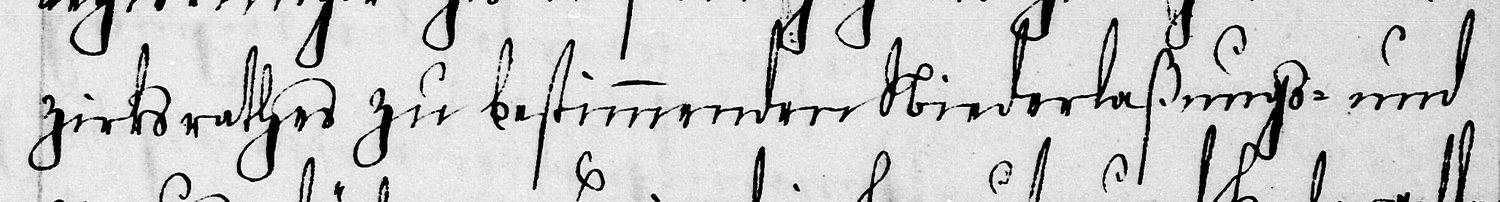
zirksrathes zu bestimmenden Niederlaßungs- und
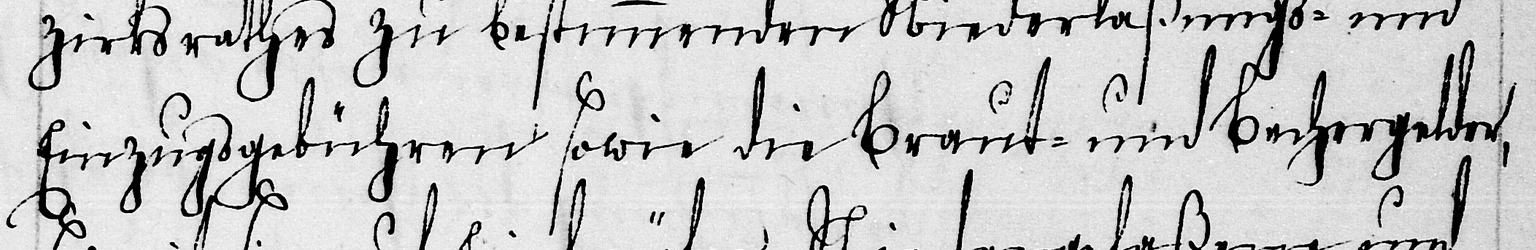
Einzugsgebühren sowie die Braut- und Bechergelder,
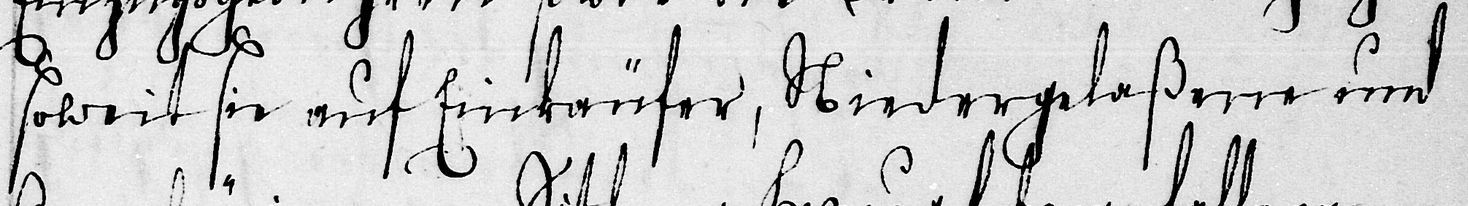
soweit sie auf Einkäufer, Niedergelaßene und
